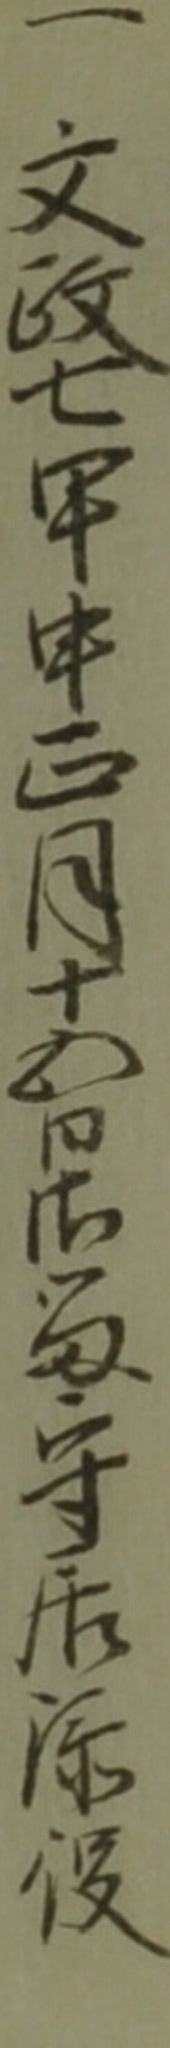一文政七甲申正月十五日御留守居添役
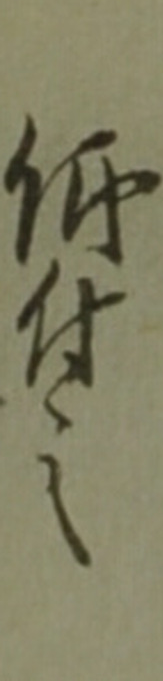仰付之
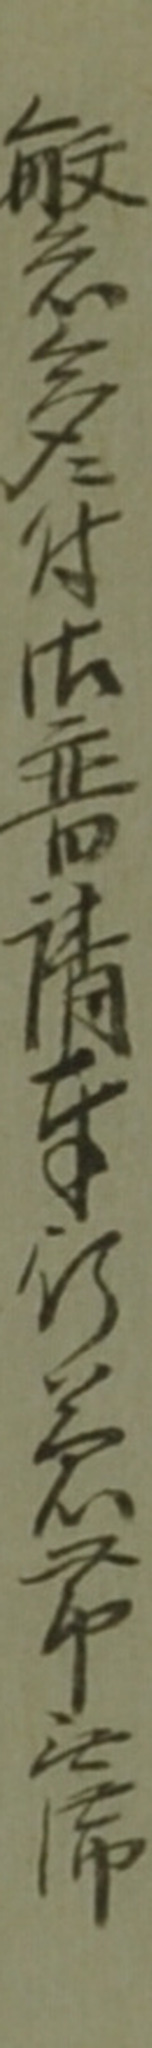繁多ニ付御普請奉行兼帯無滞
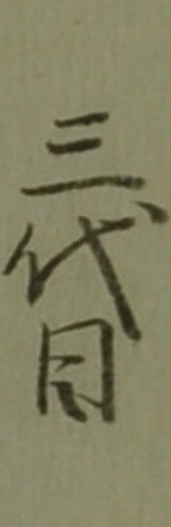三代目
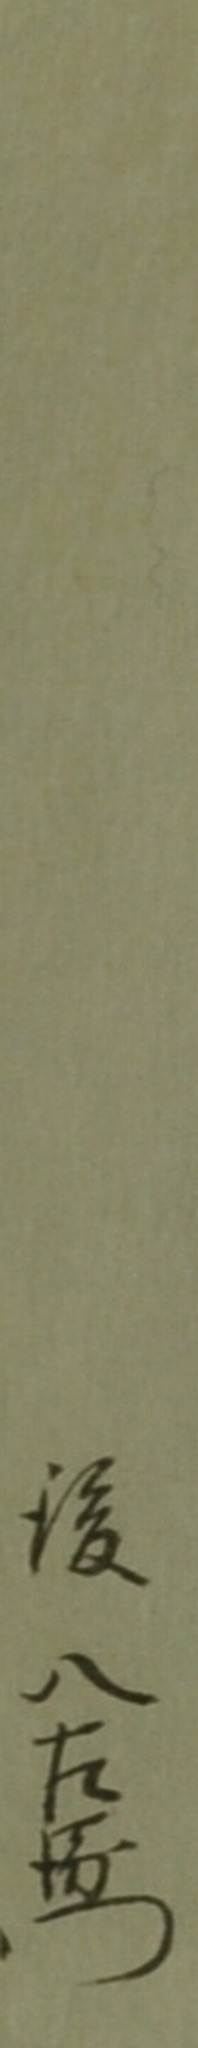後八左衛門
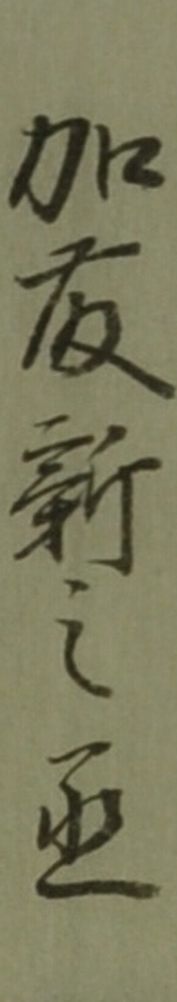加藤新之丞
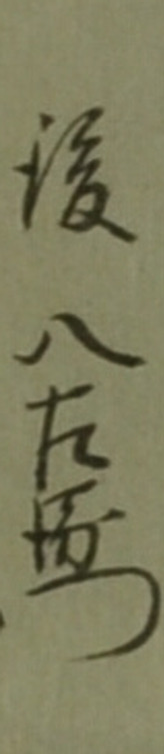後八左衛門
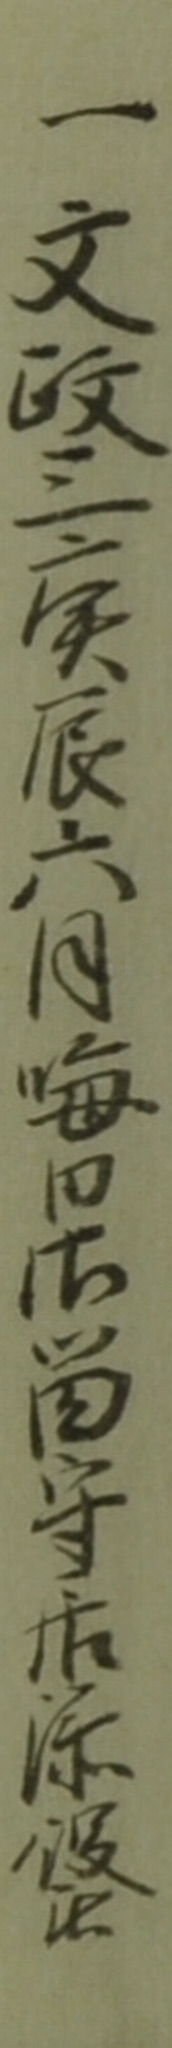一文政三庚辰六月晦日御留守居添役被
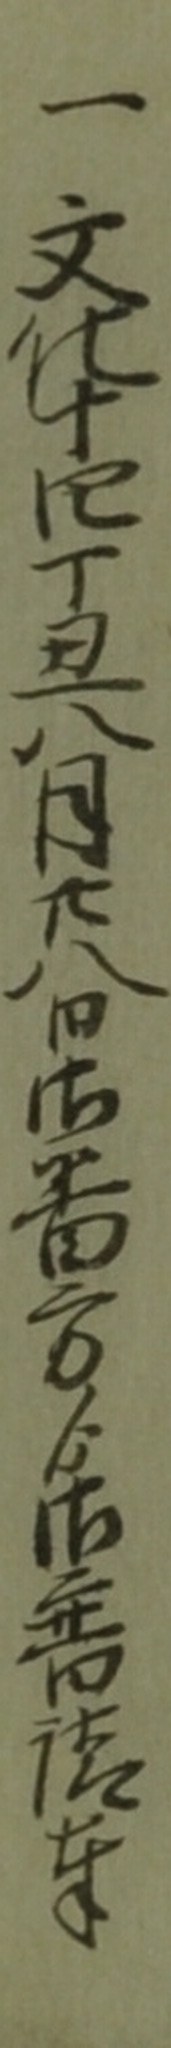一文化十四丁丑八日御番方ゟ御普請奉
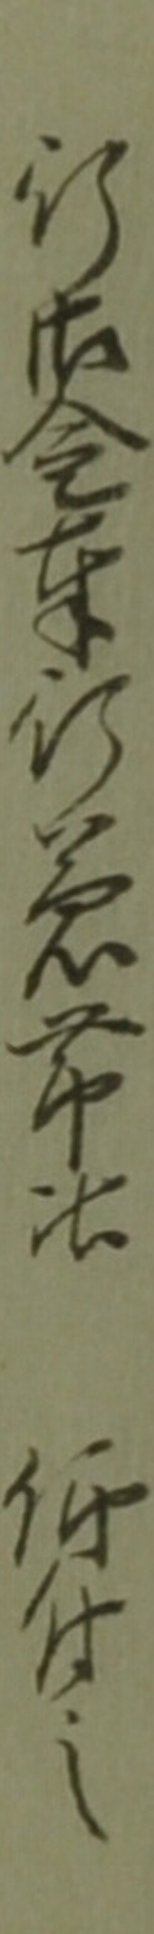行御金奉行兼帯被仰付之
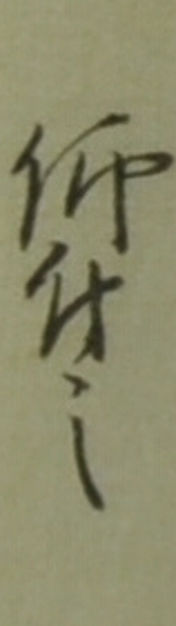仰付之

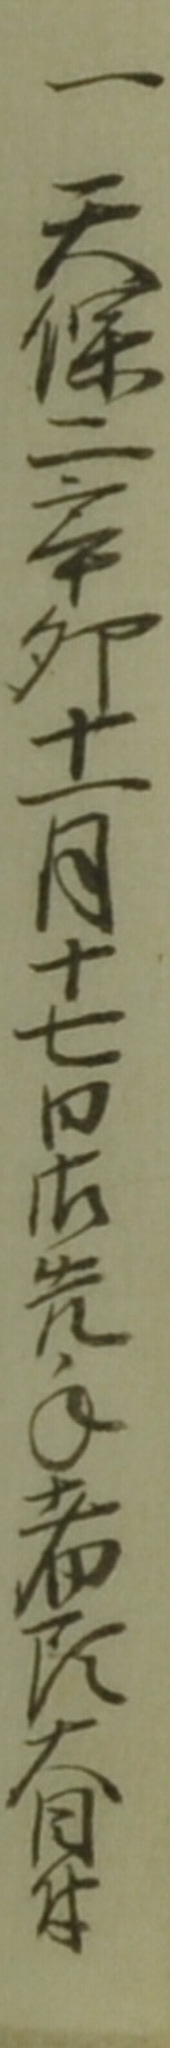一天保二辛卯十一月十七日御先手番頭大目付
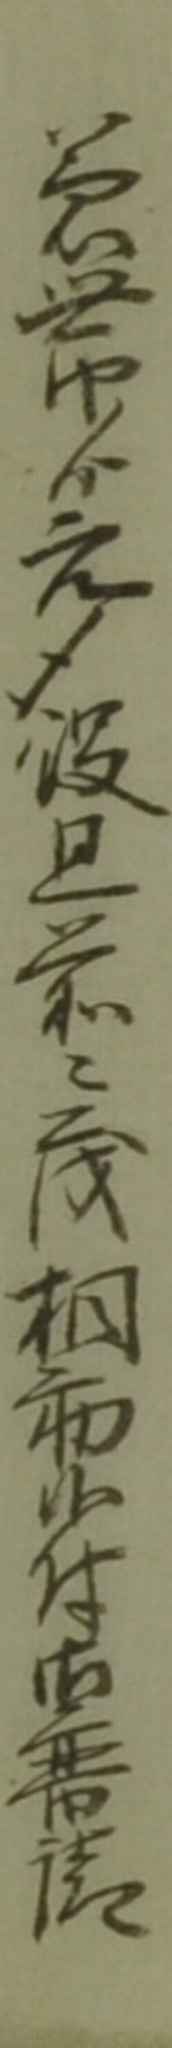兼帯ゟ元〆役且前ニ茂相勤候付御普請
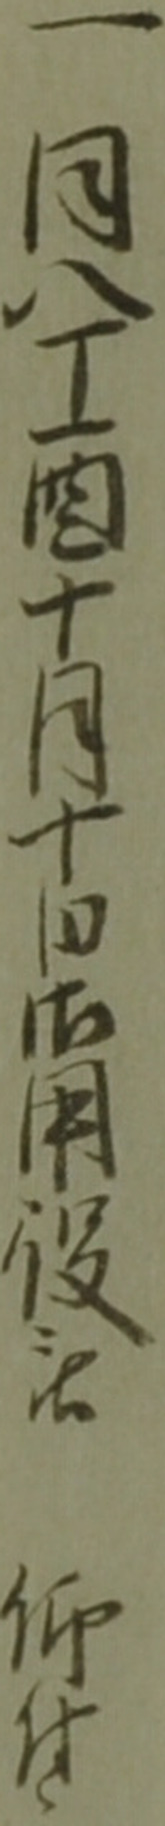一同八丁酉十月十日御用役被仰付之
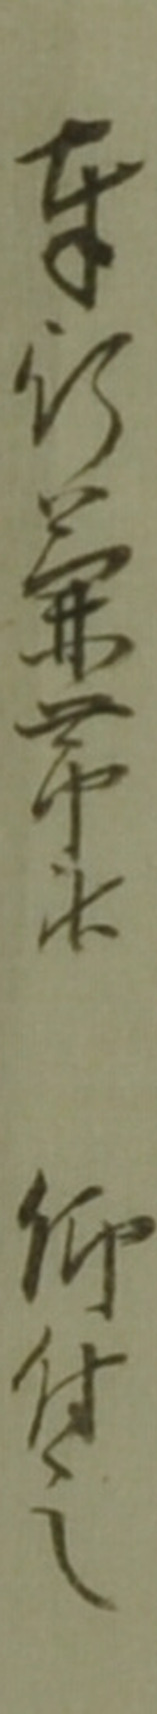奉行兼帯被仰付之
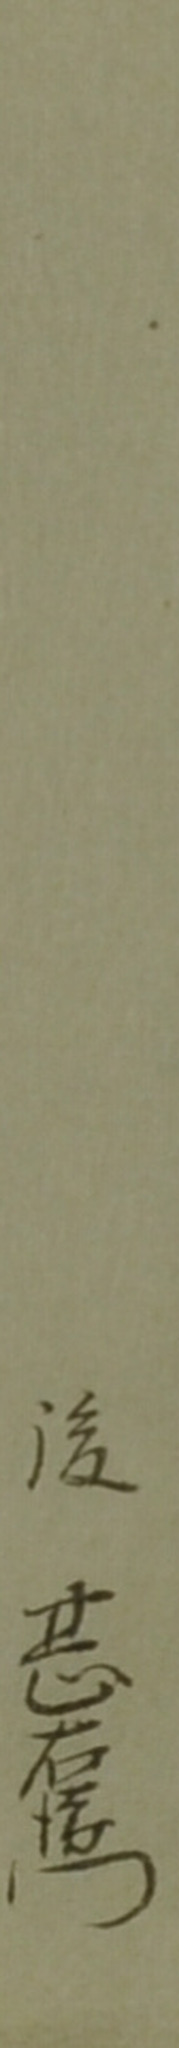後甚右衛門
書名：諸御役代々録（六）
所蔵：伊那市立高遠町図書館・合同会社AMANE
